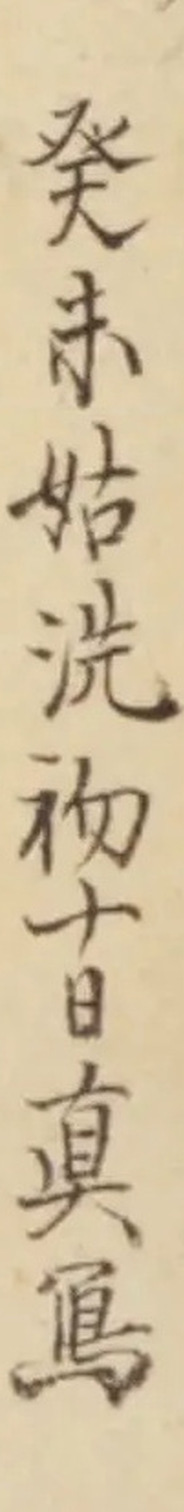癸未姑洗初十日真写
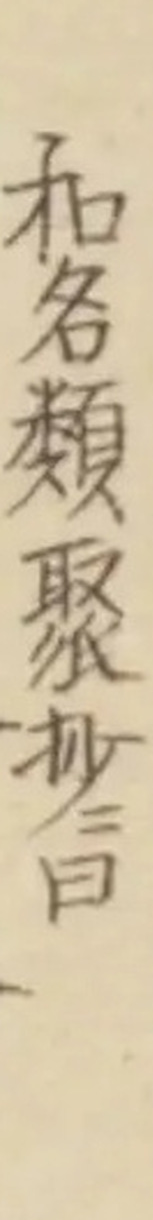和名類聚抄曰
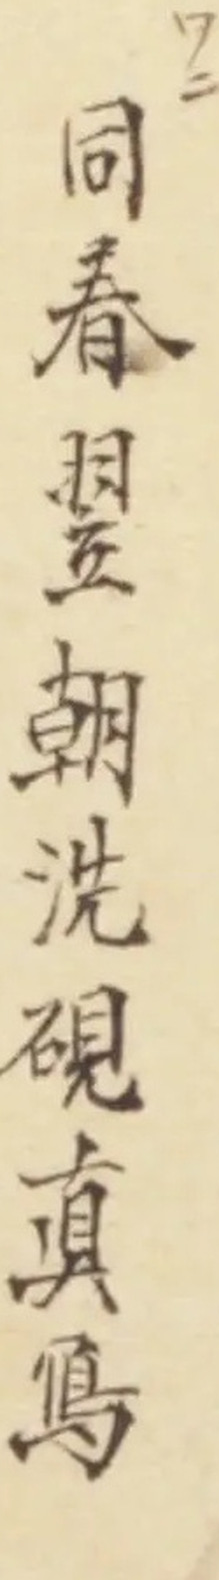同春翌朝洗硯真写
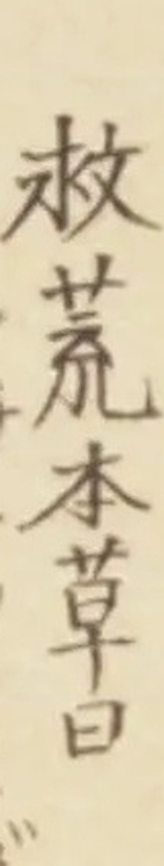救荒本草曰
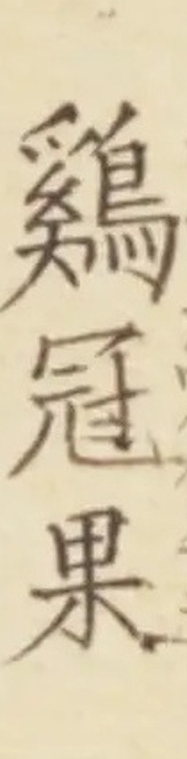鶏冠果
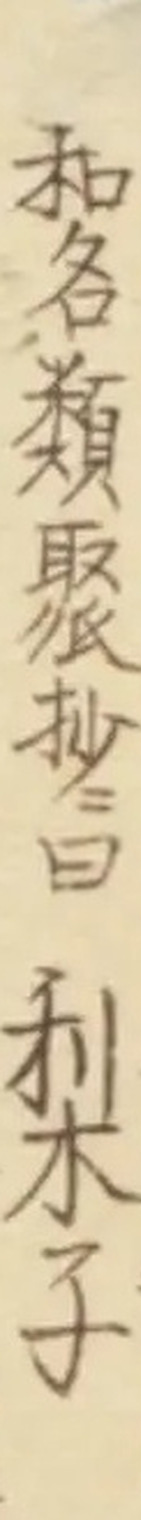和名類聚抄曰梨子
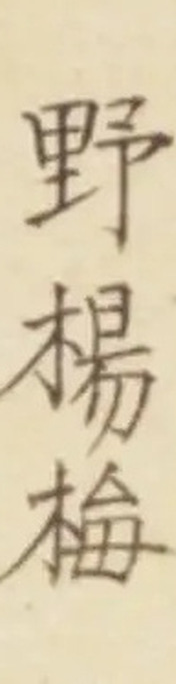野楊梅
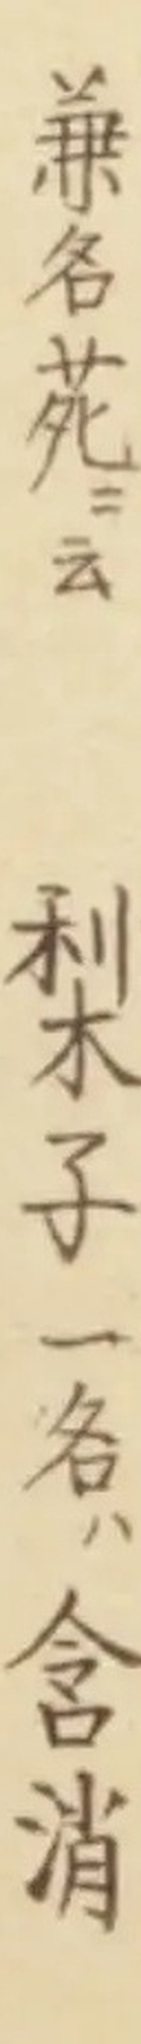兼名苑曰梨子一名含消
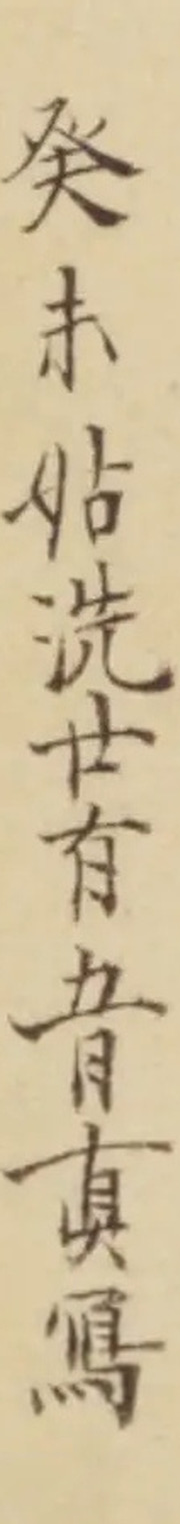癸未姑洗廿五日真写

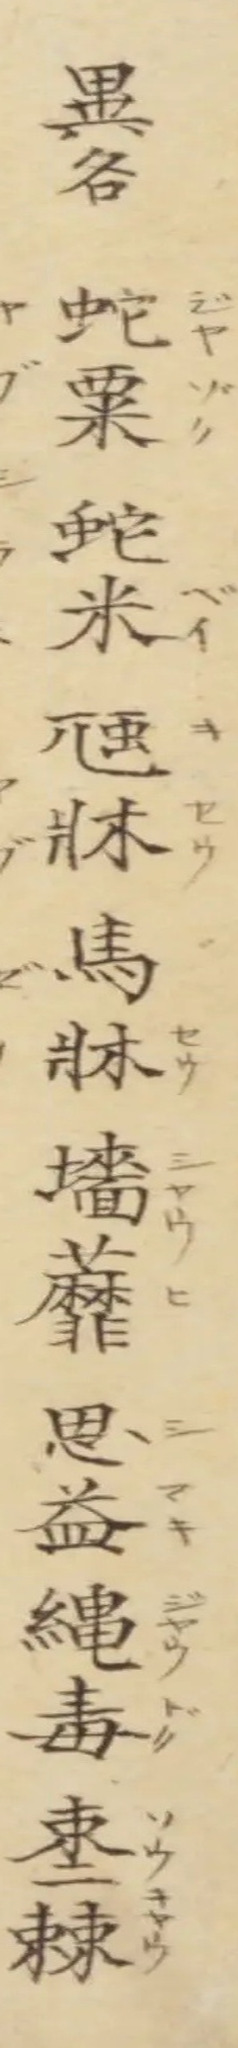異名蛇粟蛇米虺牀馬牀墻蘼思益縄毒棗棘
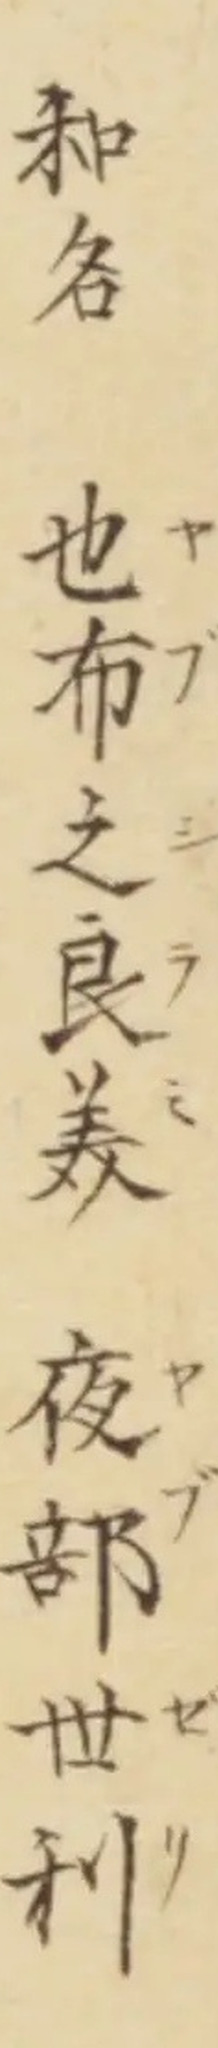和名也布之良美夜部世利
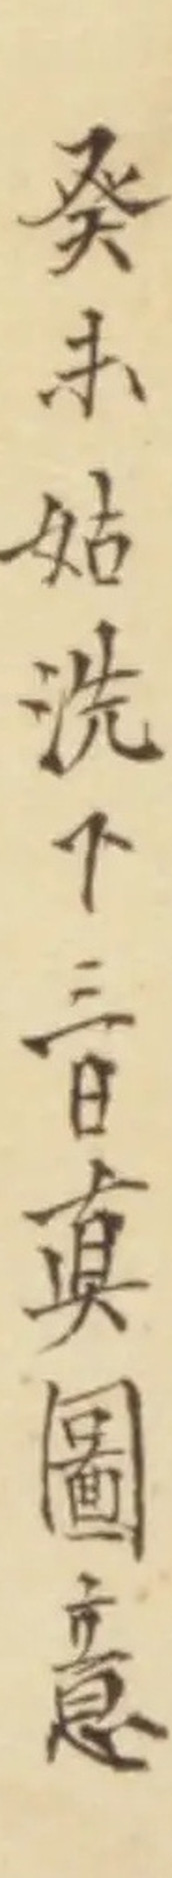癸未姑洗下三日真図意
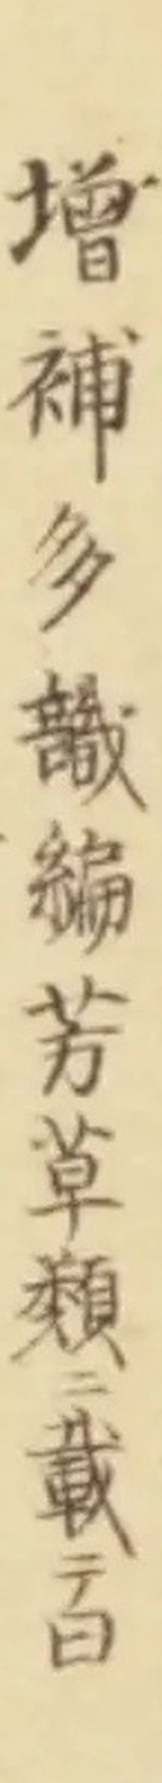増補多識編芳草類載曰
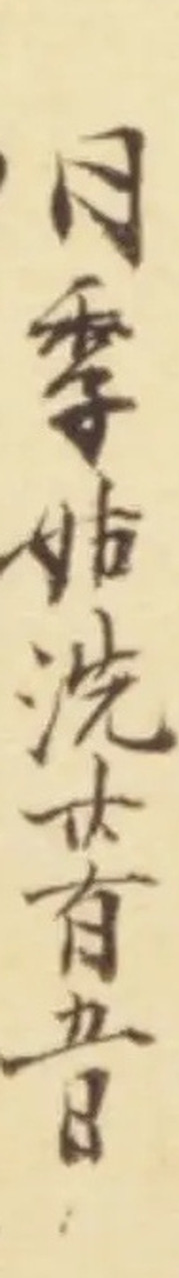同季姑洗廿有五日
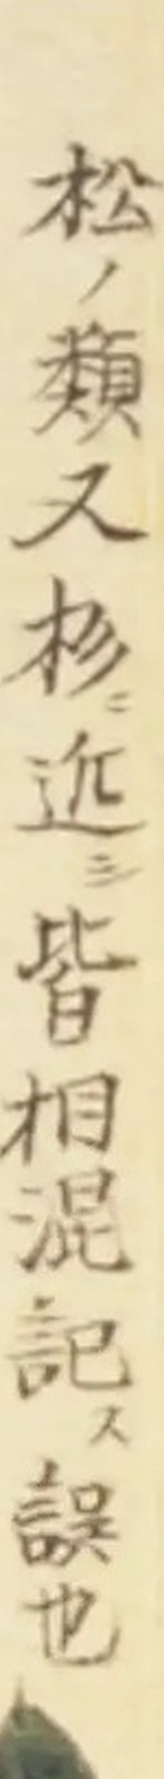松ノ類又杉ニ近シ皆相混記ス誤也
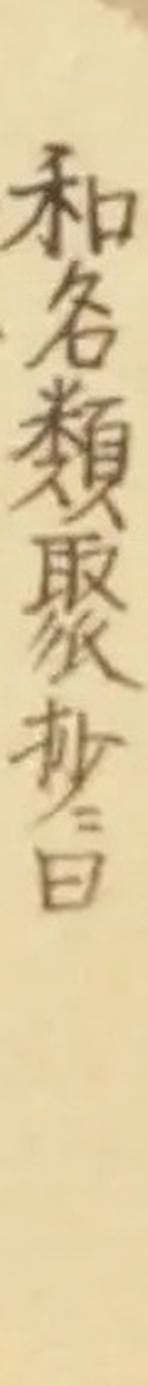和名類聚抄曰
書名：梅園草木花譜春之部. 1
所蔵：国立国会図書館 National Diet Library, JAPAN
